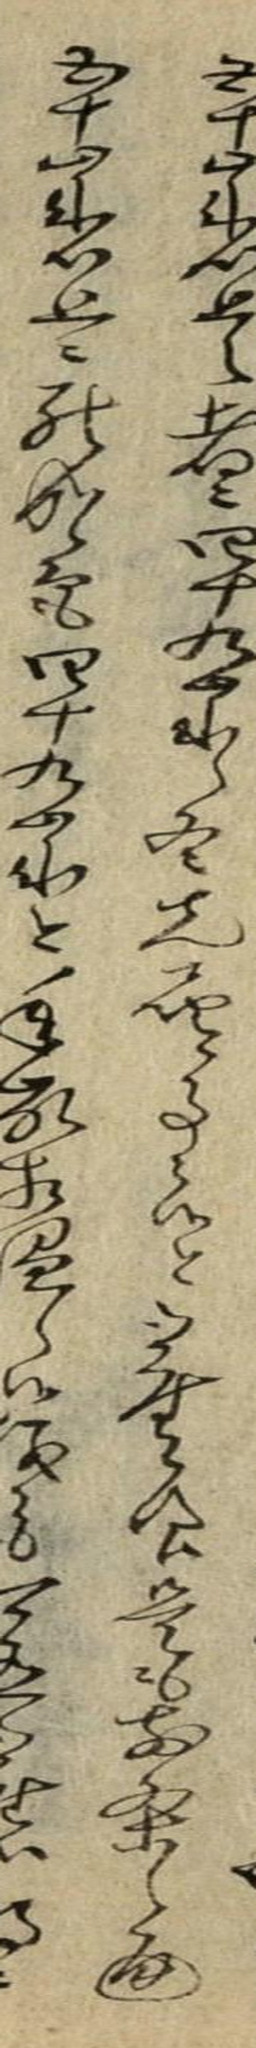五十歳以上ニ罷成候而も四十九歳と年齢相隠し候儀ニも可有御座哉将ニ
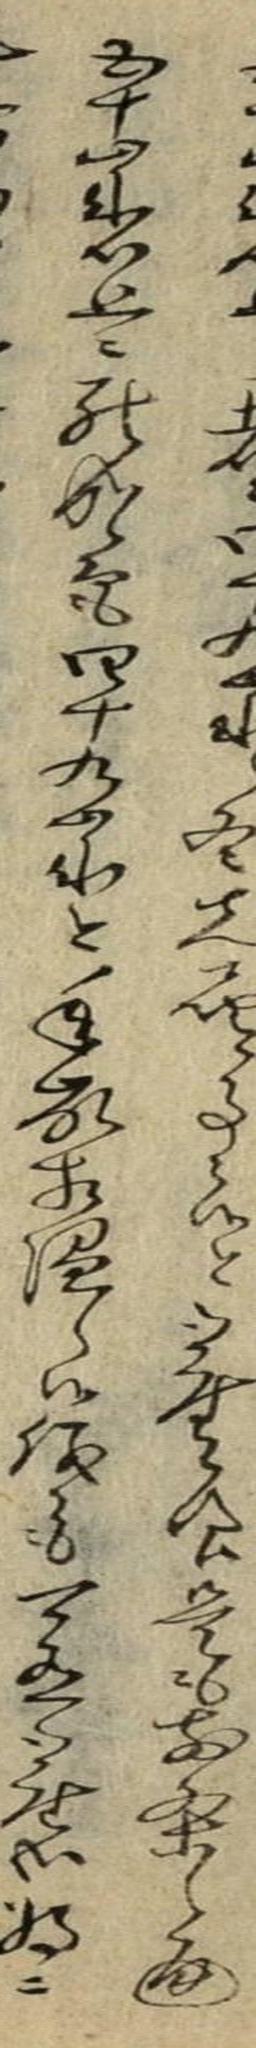五十歳以上ニ罷成候而も四十九歳と年齢相隠し候儀ニも可有御座哉将ニ
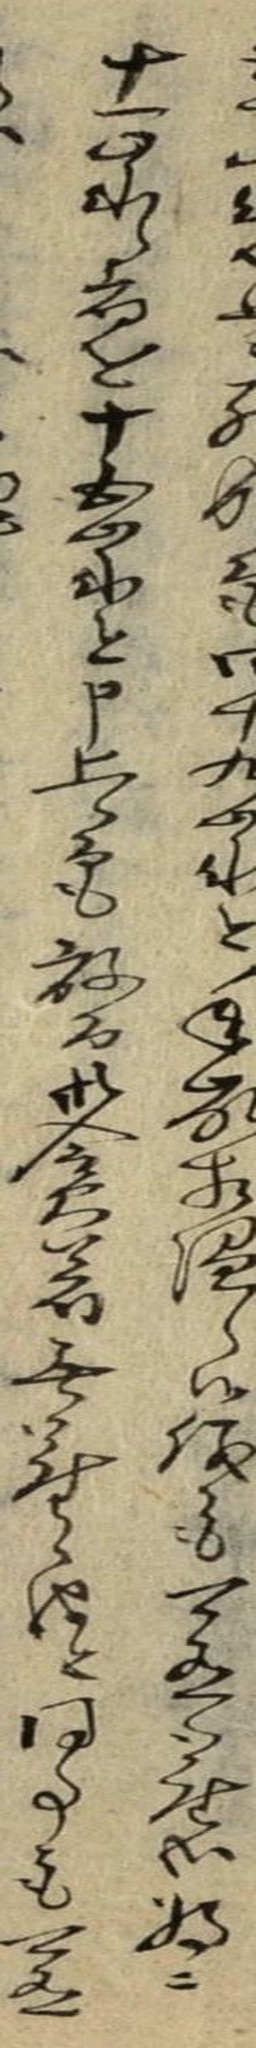十一歳之者を十五歳と申上候而も敢而御貪着無御座候儀と同事ニ可有
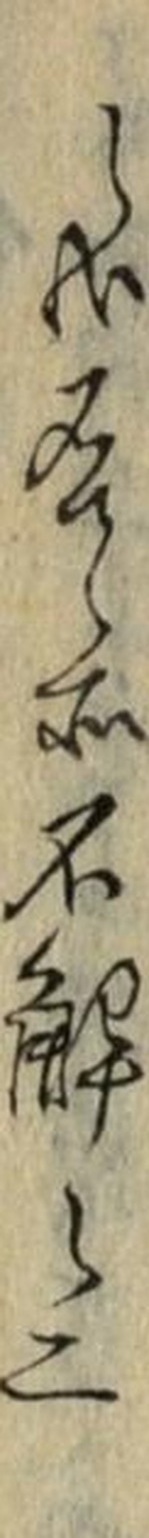之哉否之所不解之二
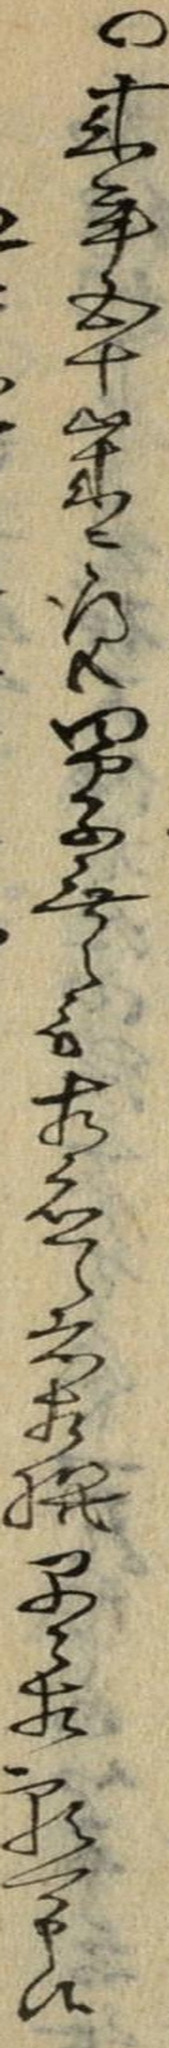〇来年五十歳ニ候得共男子無之ニ付相応之者相撰早々相願可申候
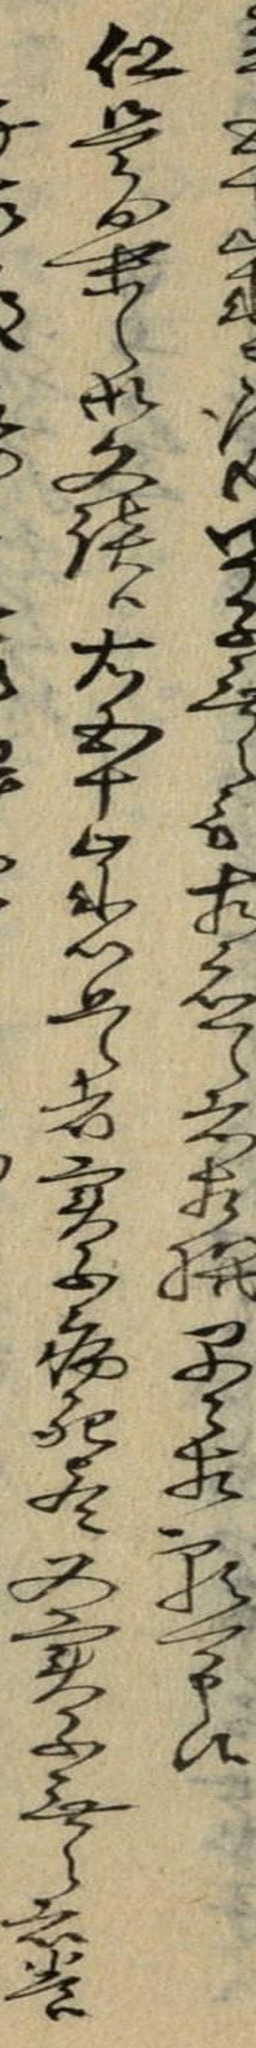但是ゟ末之御文談ハ右五十歳以上之者実子病死歟又実子無之者養
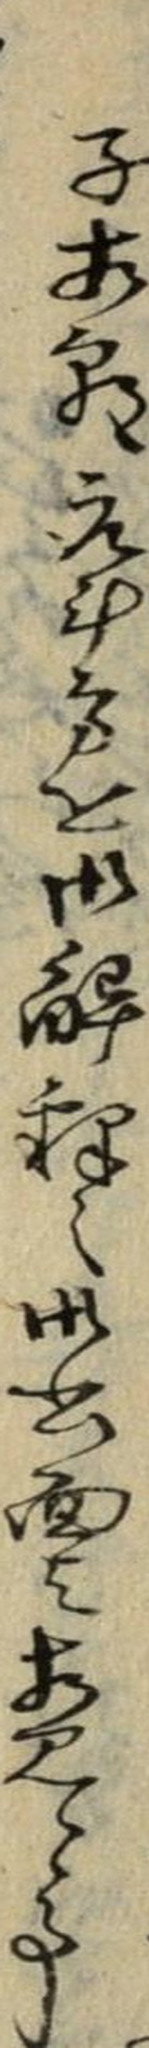子相願候取計方を御解釈之御書面与相見へ候事
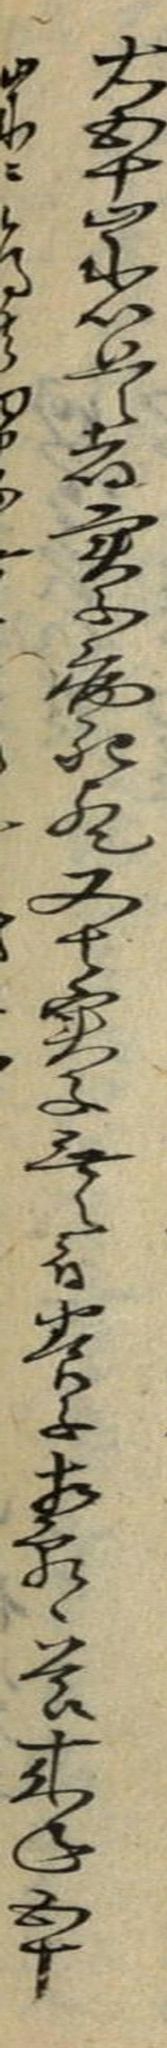右五十歳以上之者実子病死歟又者実子無之候ニ付養子相願候節来年五十
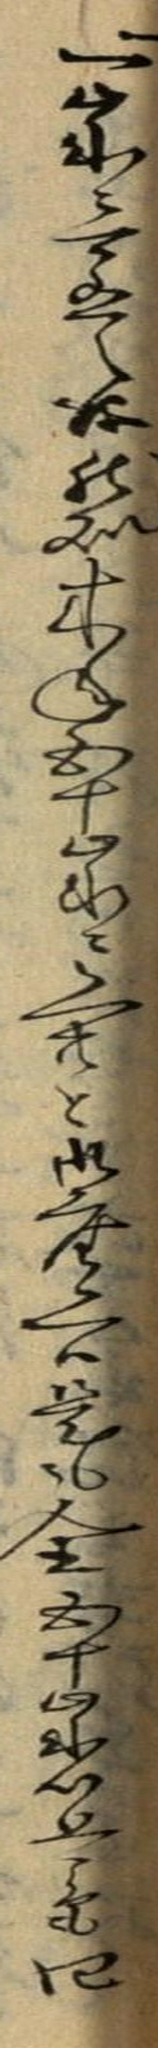一歳ニ可有之儀然処来年五十歳ニ候へ共と御座候へハ是も全五十歳以上ニ而も四
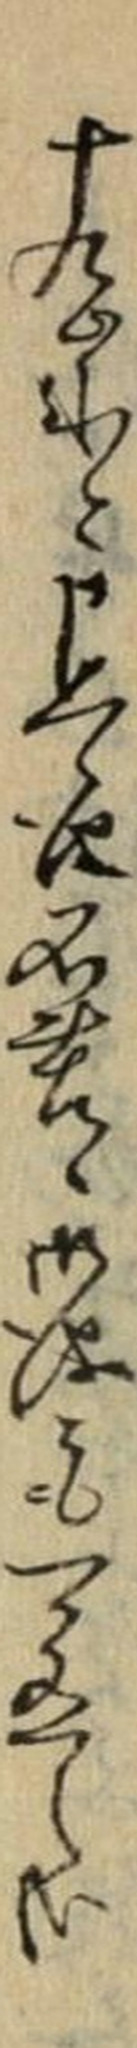十九歳と申上候儀不苦候御儀ニも可有之哉
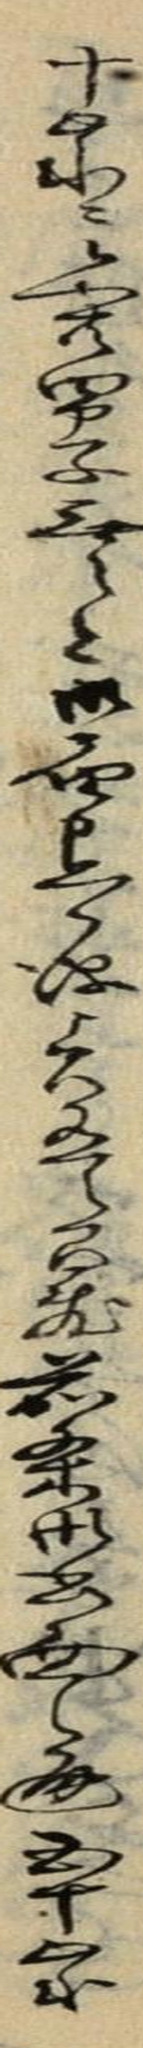十歳ニ候へ共男子無之と御届申上候儀ニ而ハ有之間敷前条御書面之通五十歳
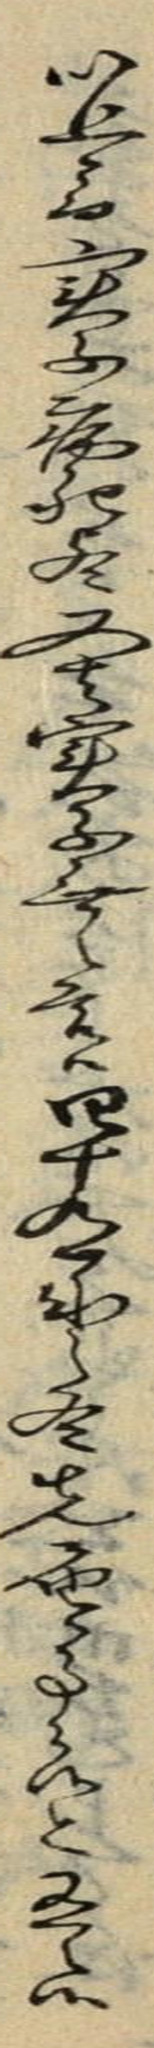以上ニ而実子病死歟又者実子無之節ハ四十九歳之冬先届候事ニ候と有之候
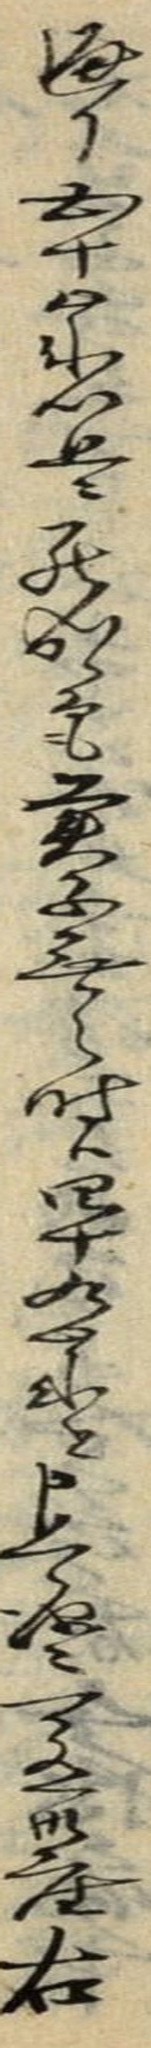通り五十歳以上ニ罷成候而も実子無之時ハ四十九歳と申上候儀ニ可有御座右
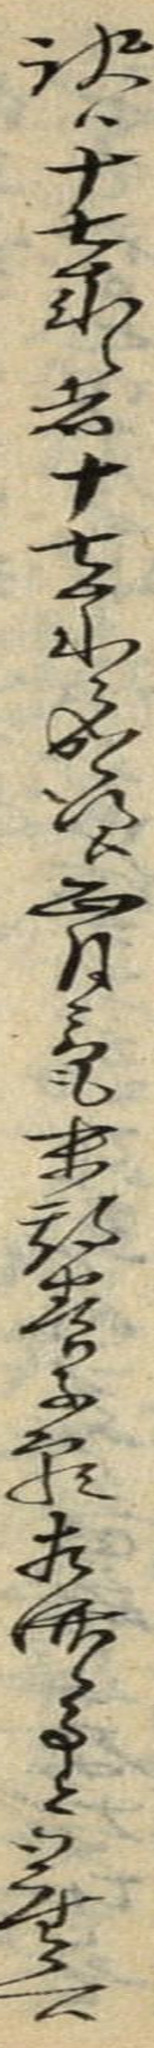訳ハ十七歳之者十七歳ニ成候得ハ正月ニ而も末期養子願相済候事と御座候へハ
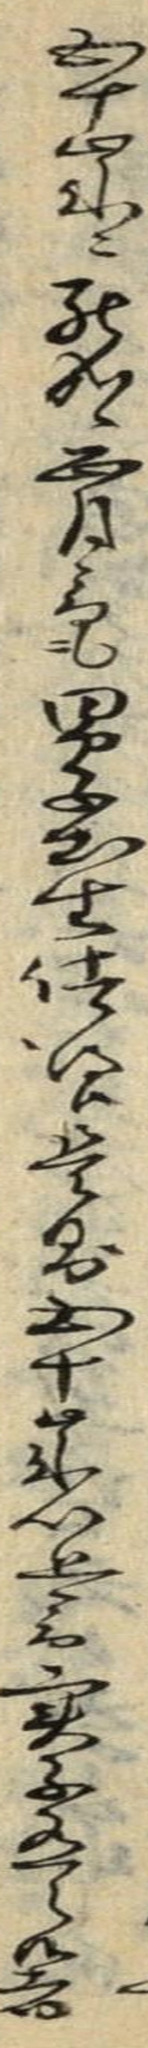五十歳ニ罷成候正月ニ而も男子出生仕候得ハ是則五十歳以上ニ而実子有之候者
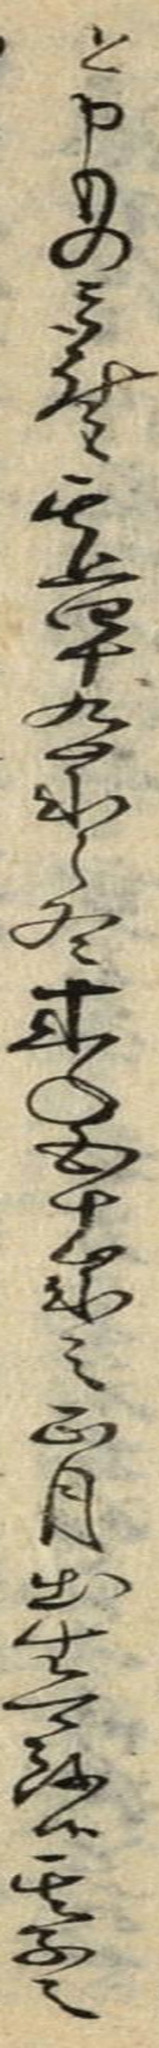と申ものニ御座候其上四十九歳之冬来年五十歳之正月出生可致候其子之
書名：養子縁組之部
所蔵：福井県文書館 Fukui Prefectural Archives
